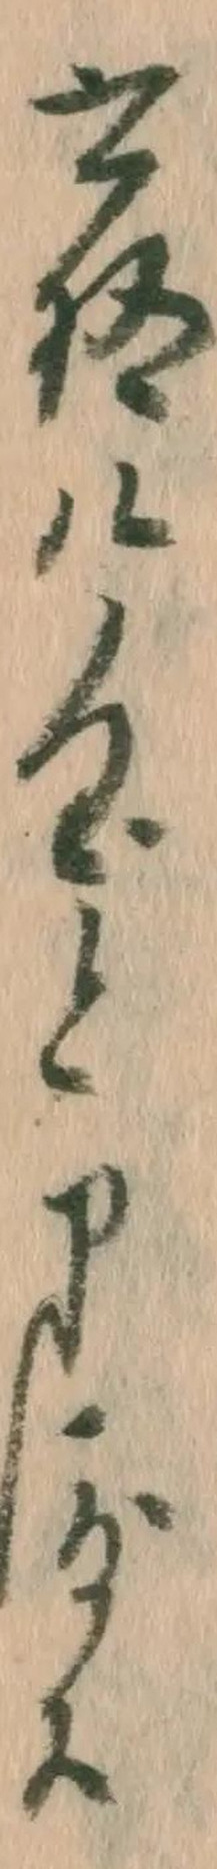六拾八匁と申渡ス
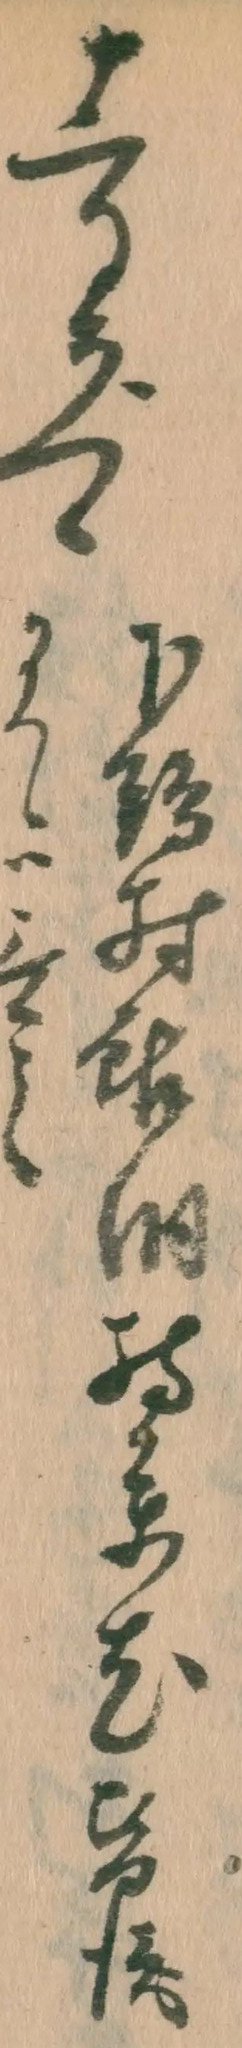十二月廿一日下鴨村鮎納持参尤皆
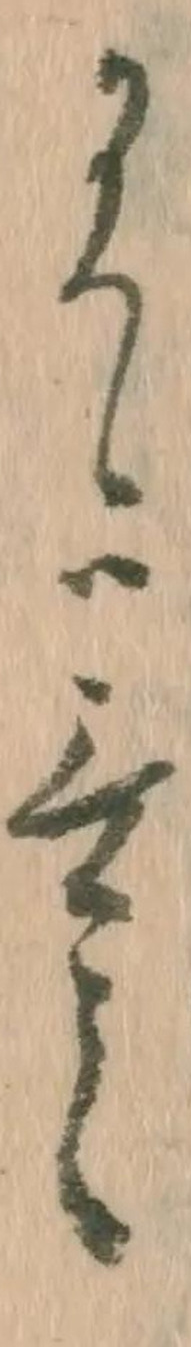にてハ無之
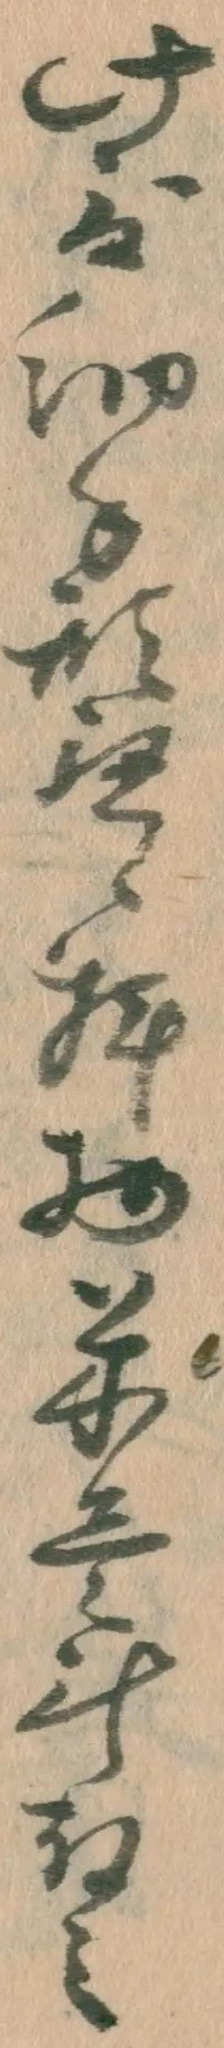此度納手形通ニ拝物米壱斗有之
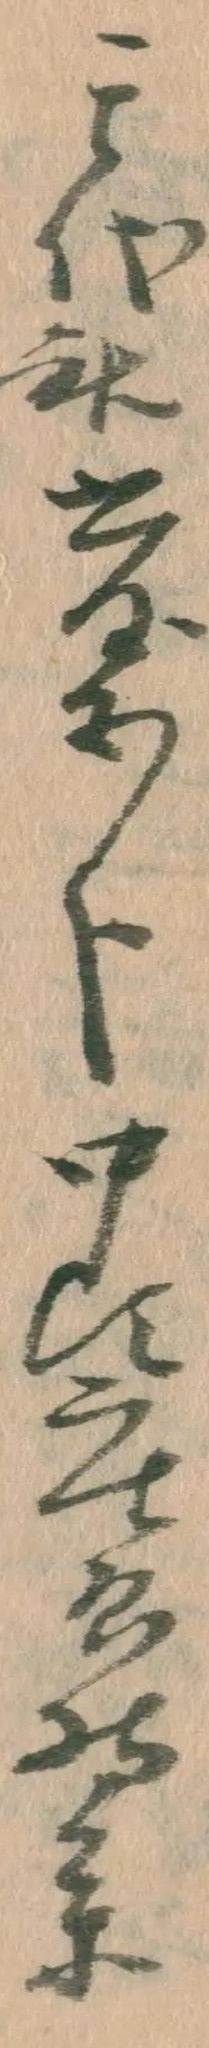其代銀六匁五分中頃庄屋持参
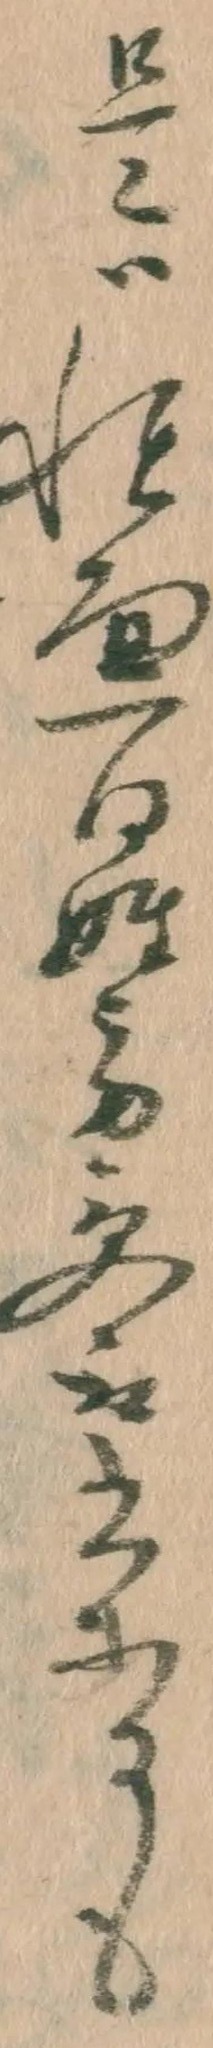是ハ帳面百姓方受取書等にも
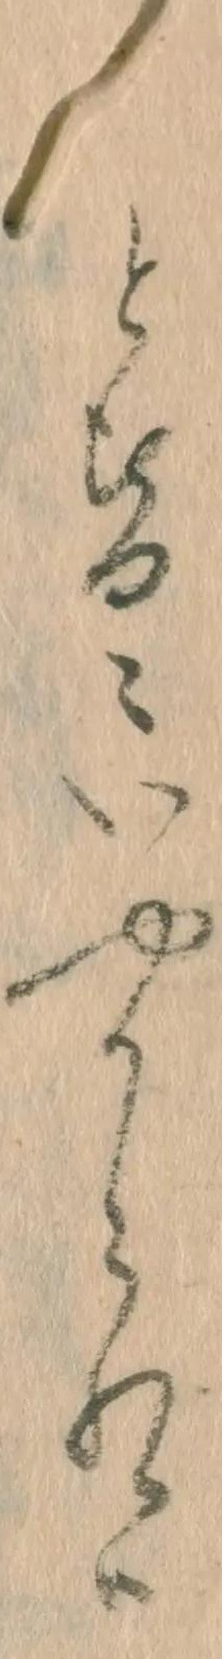と皆々いやかられ候ハ

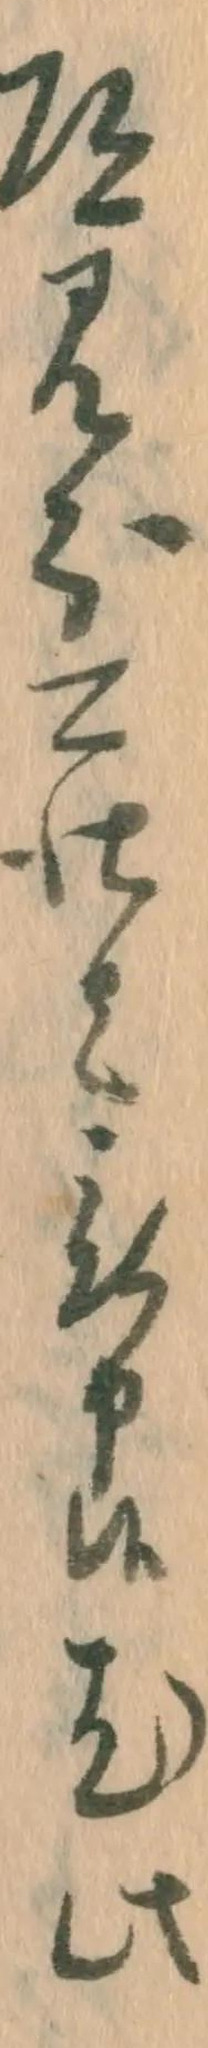道見分可仕と被申候尤此
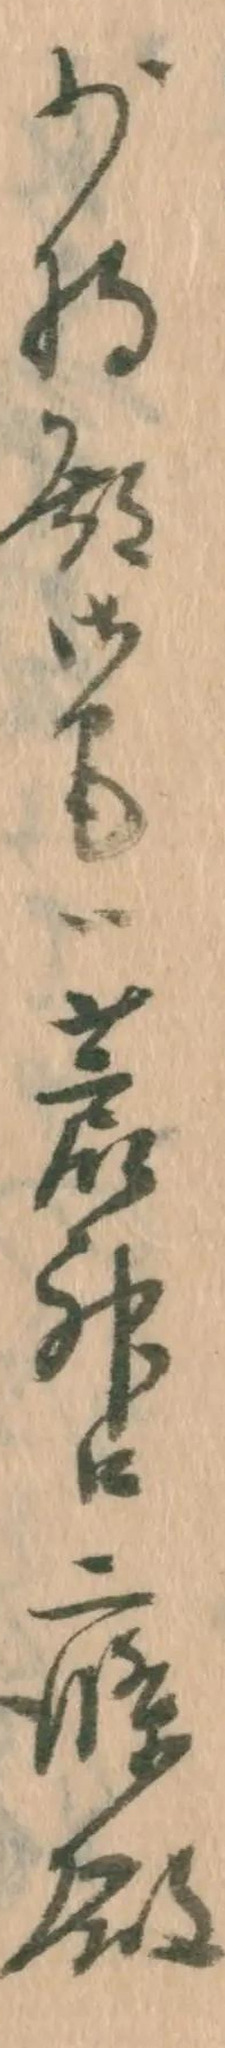少将殿御宅ハ荒神口二条殿
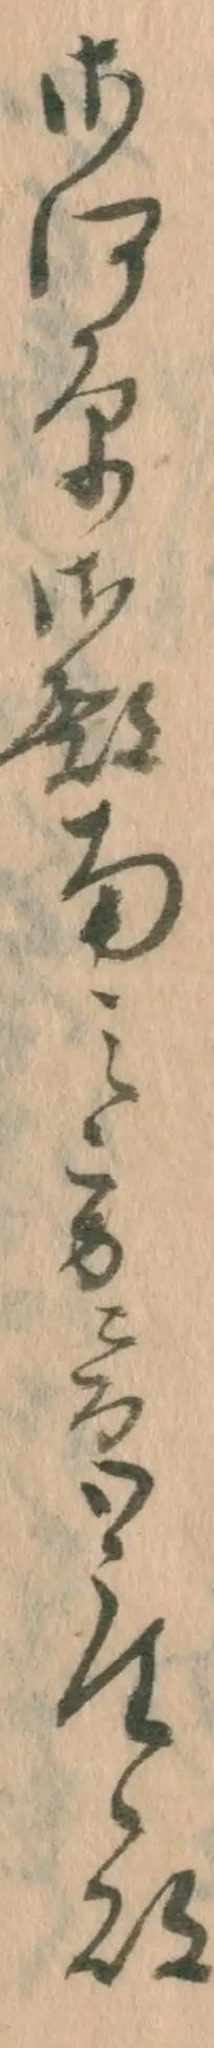御河原御殿南之方ニ而御座候故
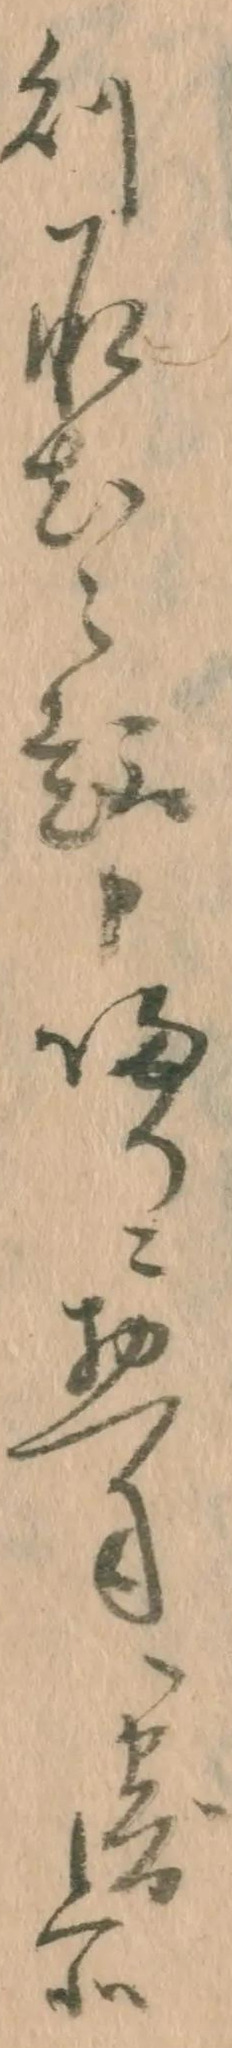則承知之趣申帰りニ惣司へ寄候所
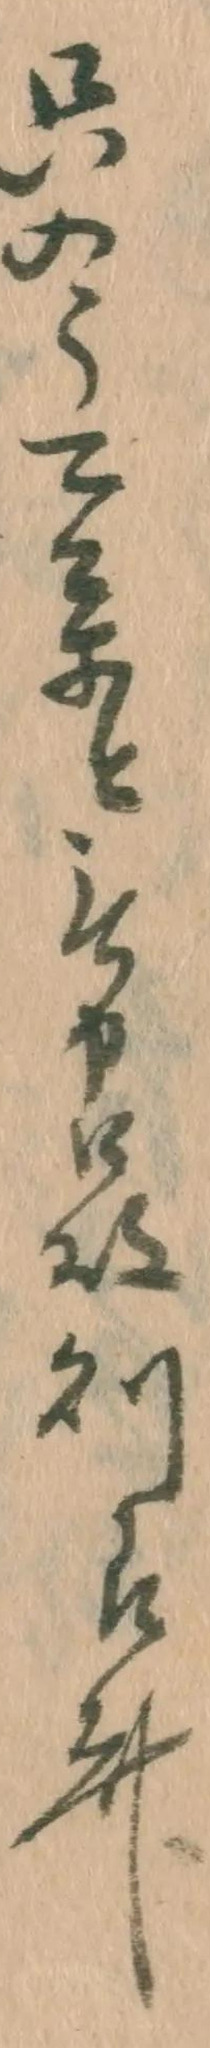只今可参と被申候故則即刻
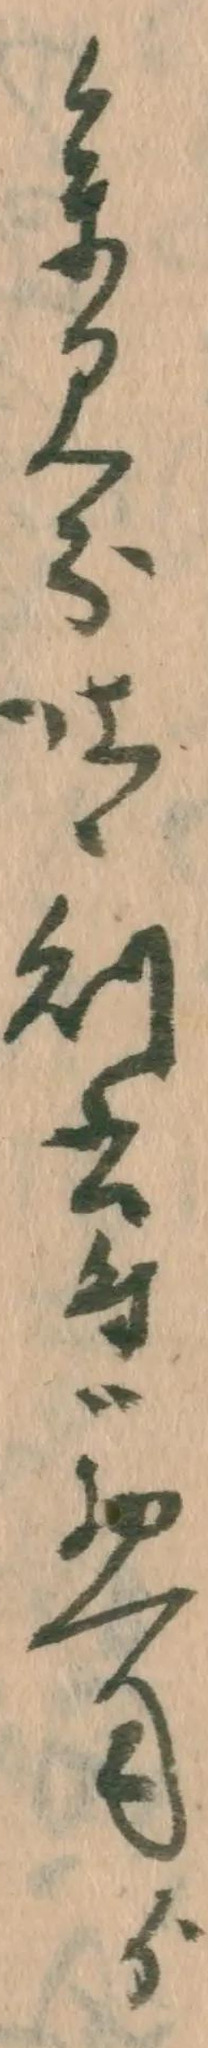参見分仕候則書付ハ惣司ゟ
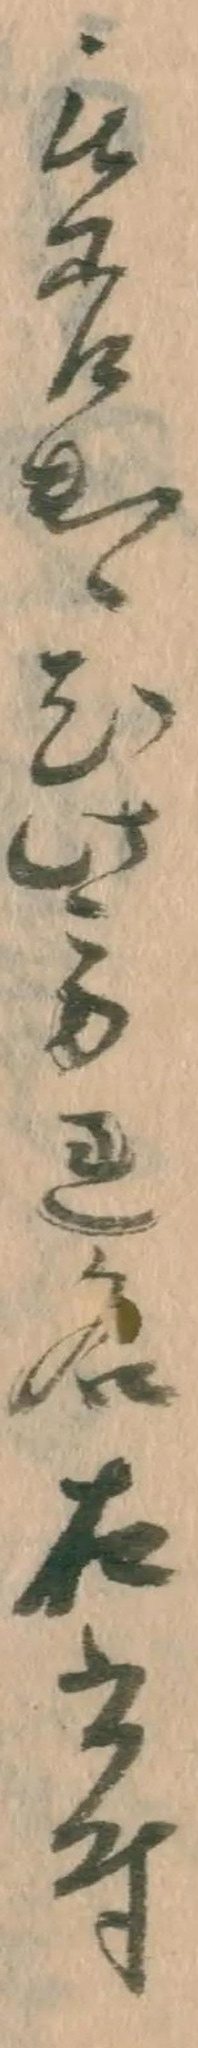被差出候尤此方連名右書付
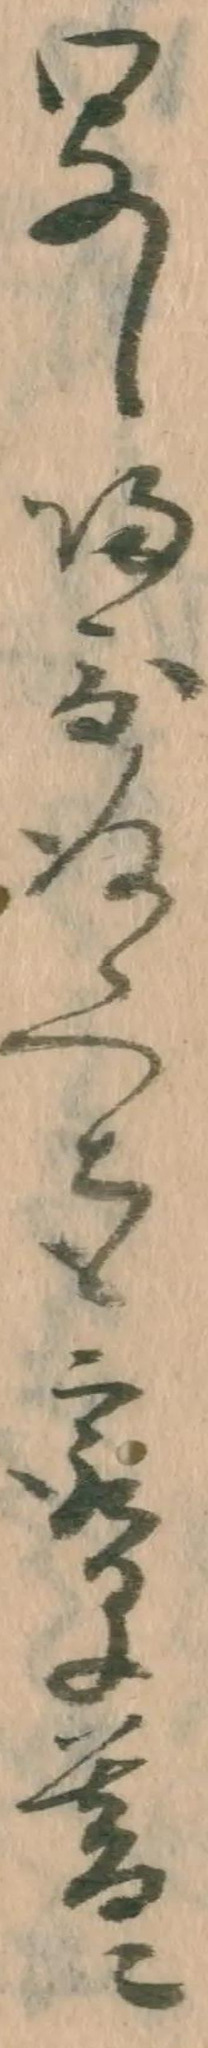写し帰度存候へとも最早暮ニ
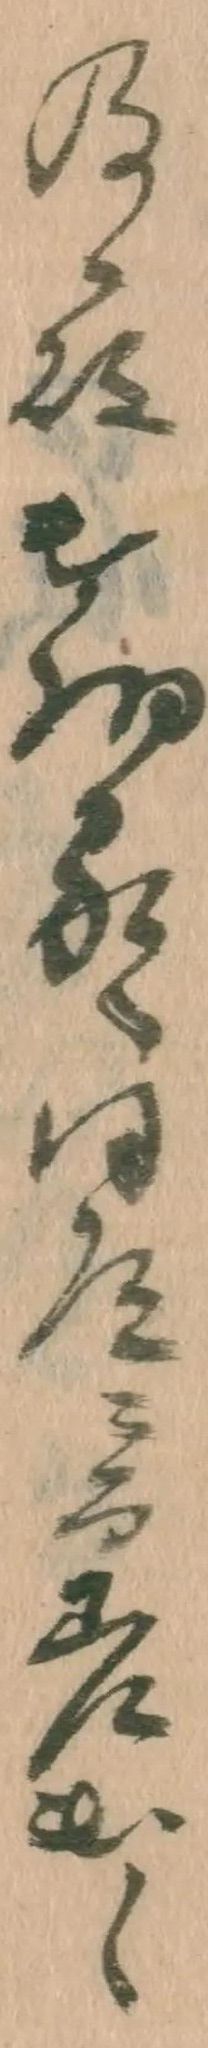及候故出納家へ同道ニ而差出し
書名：賀茂社記録. 第61冊
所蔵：国立国会図書館 National Diet Library, JAPAN
